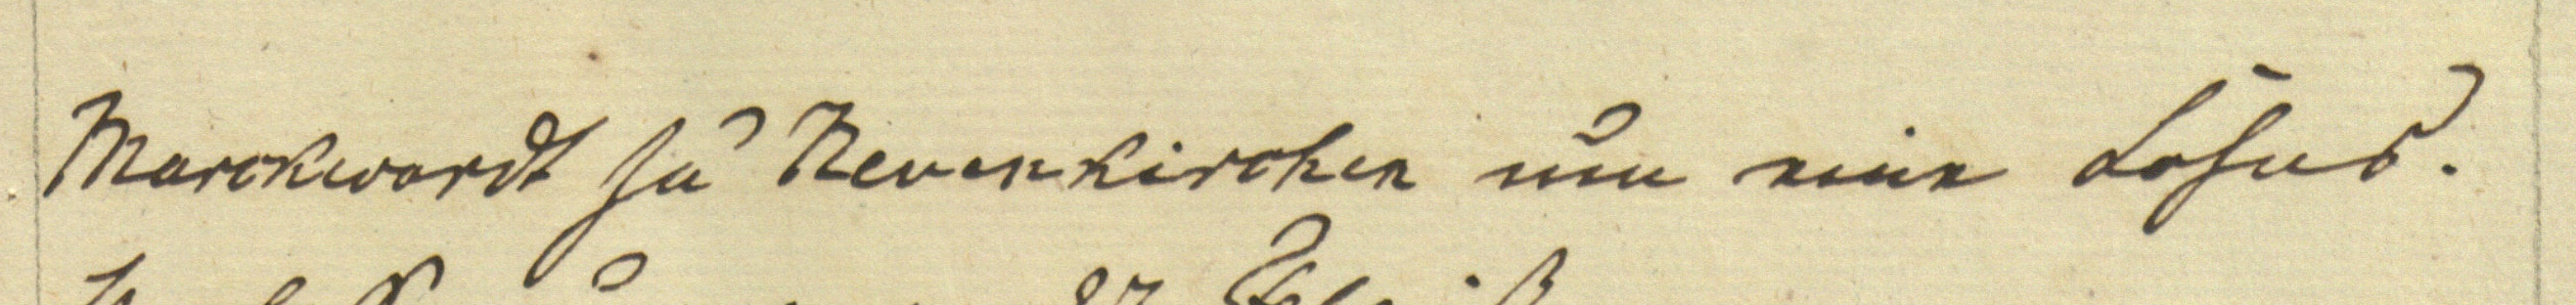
Marckwardt zu Neuenkirchen um eine Lohns¬
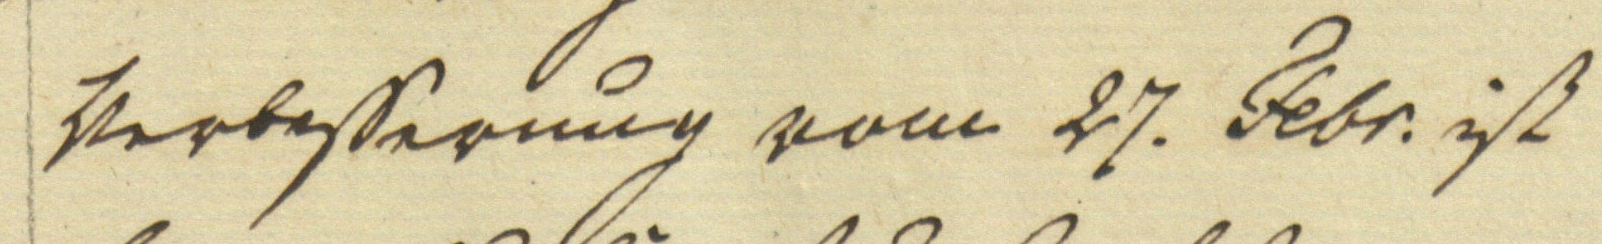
Verbesserung vom 27. Febr. ist
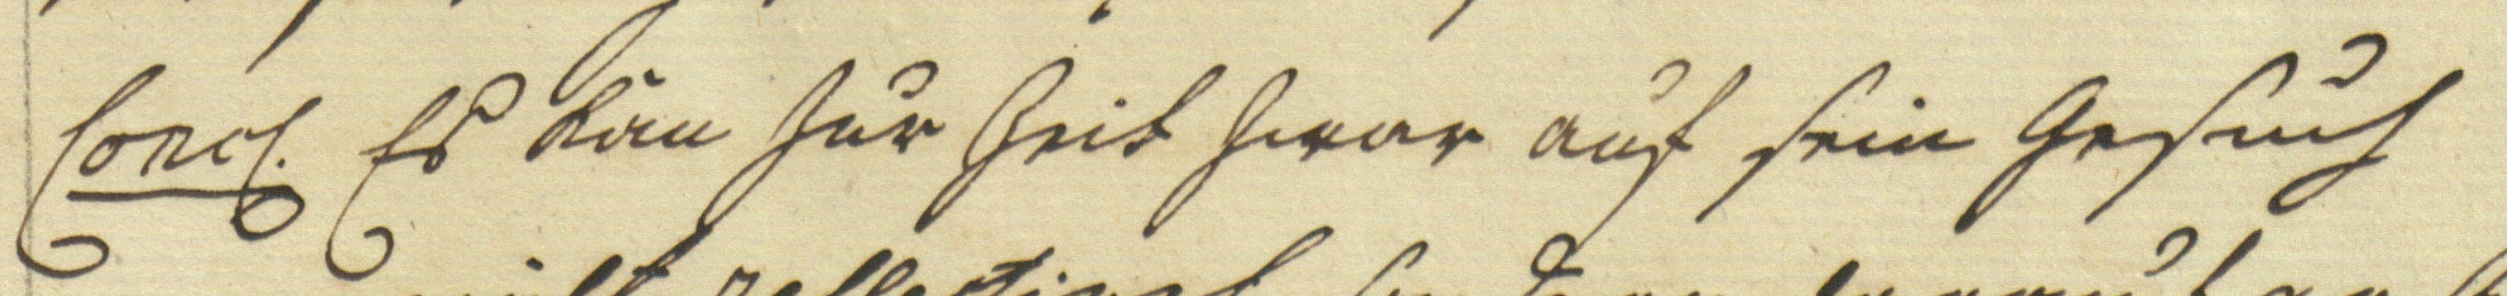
Concl. Es kan zur Zeit zwar auf sein Gesuch
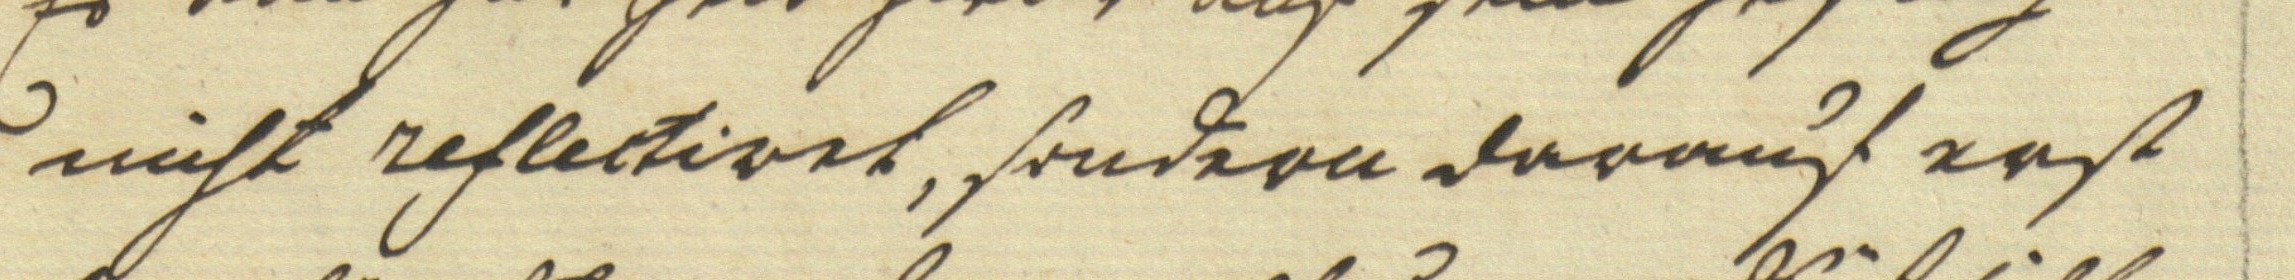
nicht reflectiret, sondern darauf erst
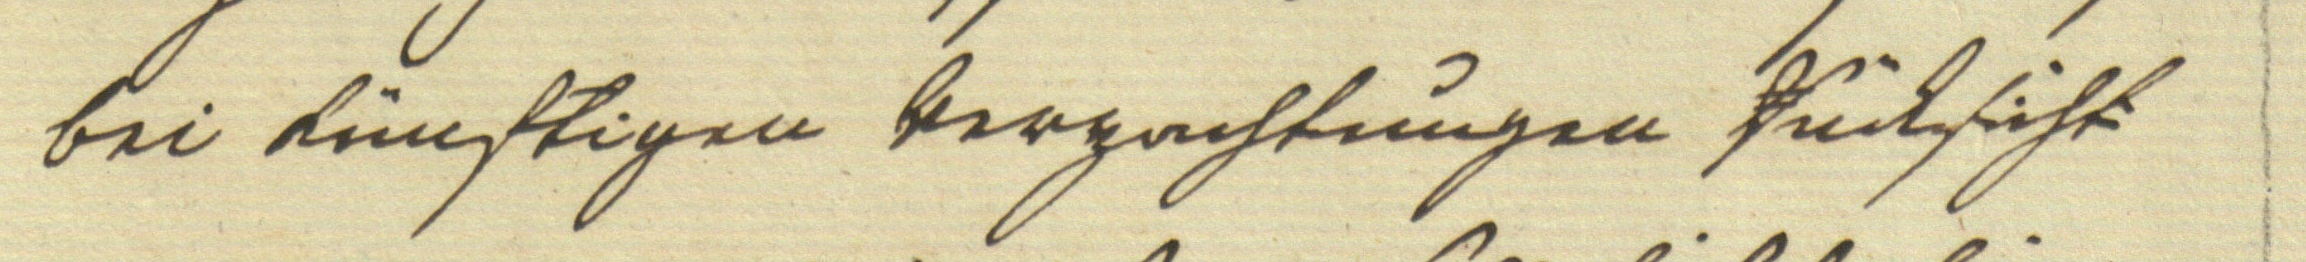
bei künftigen Verpachtungen Rücksicht
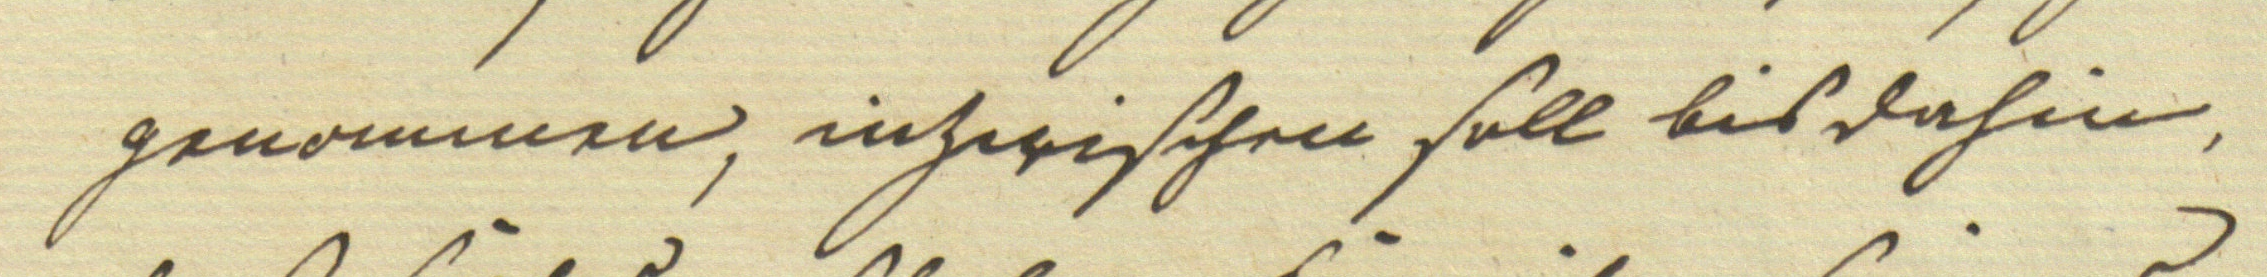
genommen, inzwischen soll bis dahin,
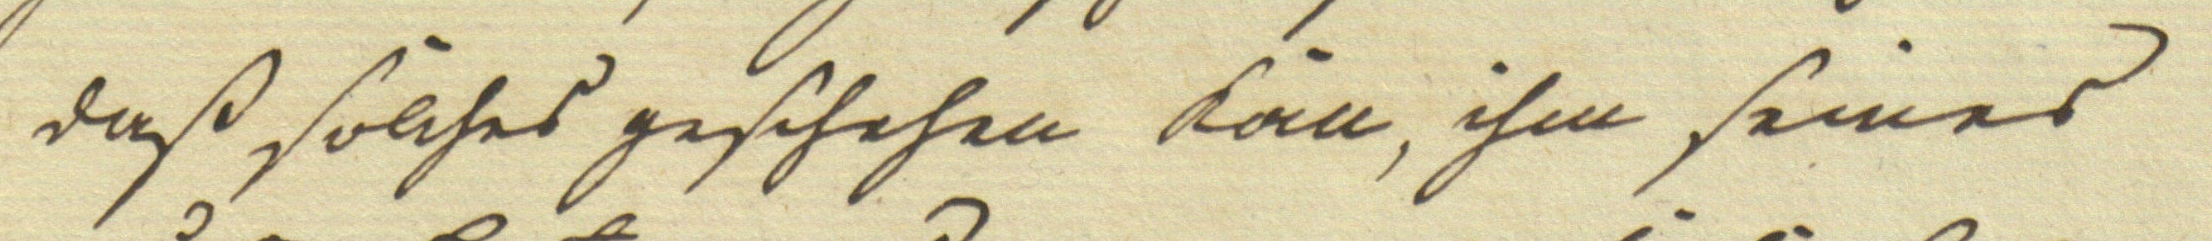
daß solches geschehen kan, ihm seines
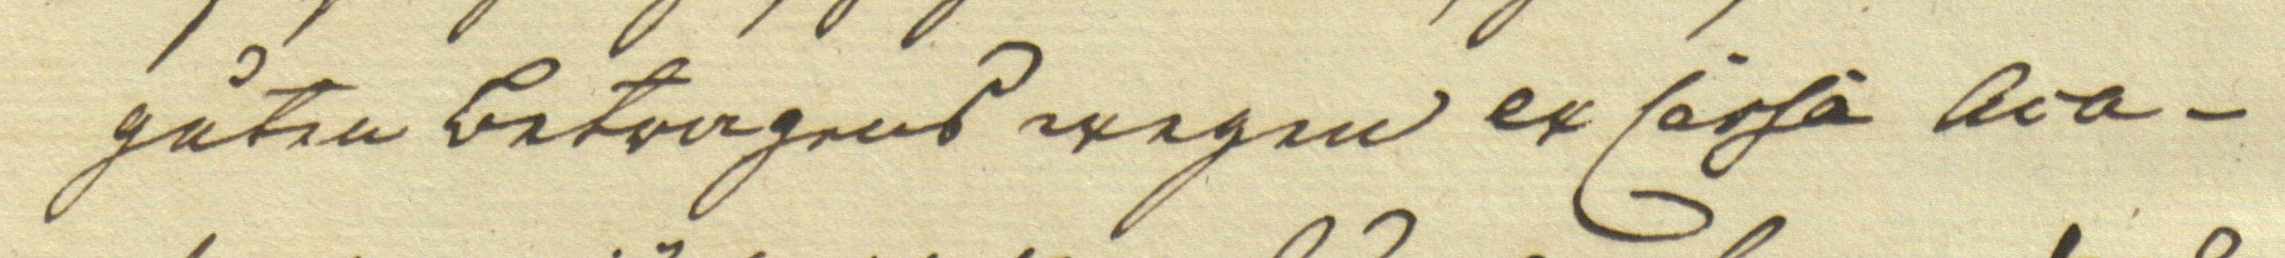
guten Betragens wegen ex Cassa Aca¬
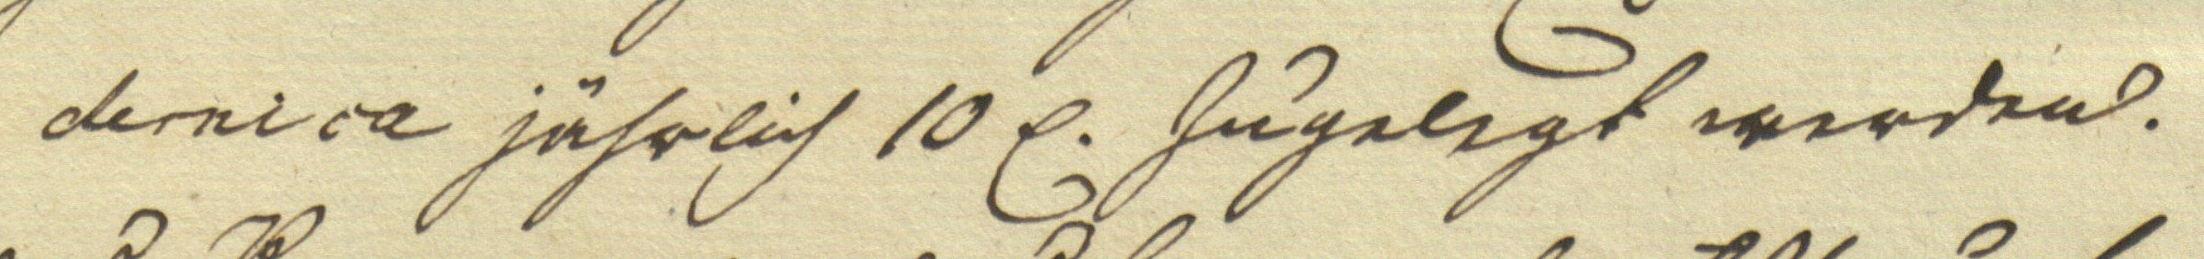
demica jährlich 10 l. zugelegt werden.
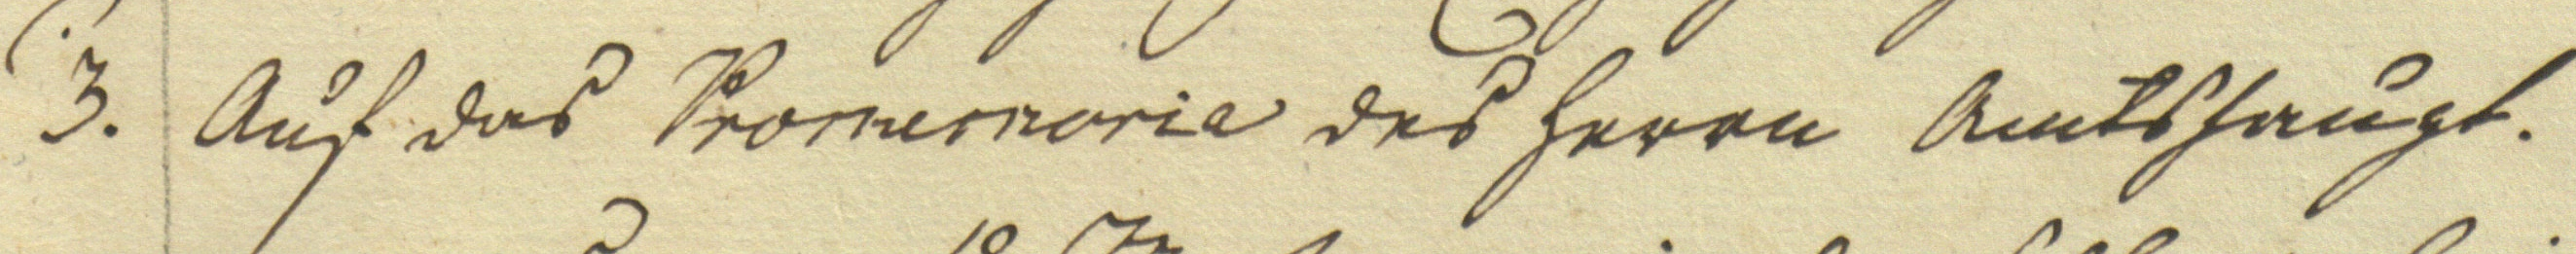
3. Auf das Promemoria des Herrn Amtshaupt¬
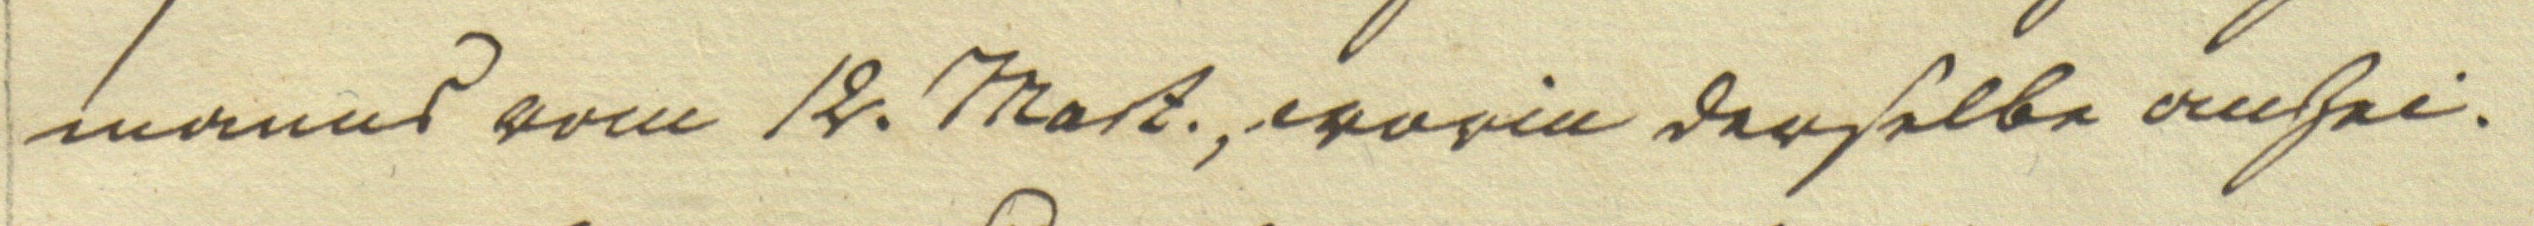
manns vom 12. Mart., worin derselbe anzei¬
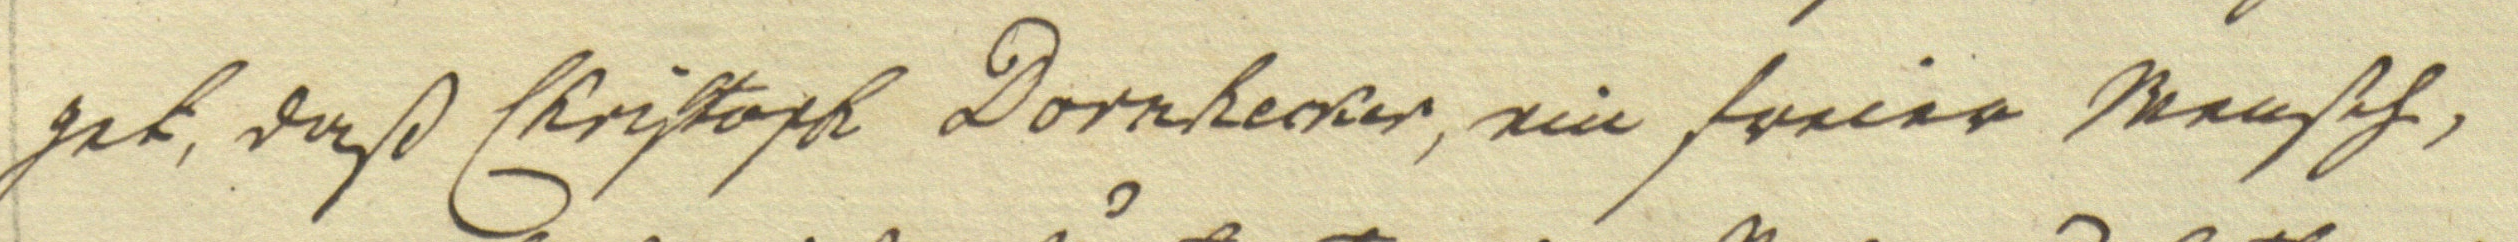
get, daß Christoph Dornhecker, ein freier Mensch,
